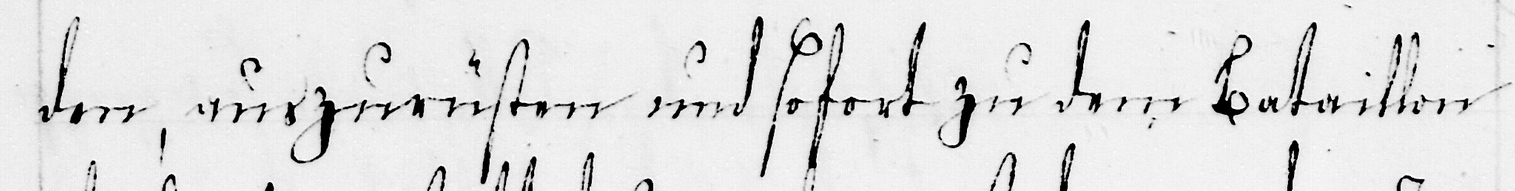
den, auszurüsten und sofort zu dem Bataillon
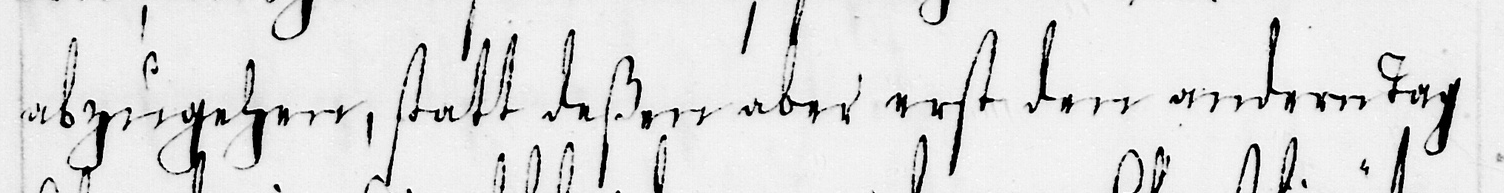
abzugehen, statt deßen aber erst den andern Tag
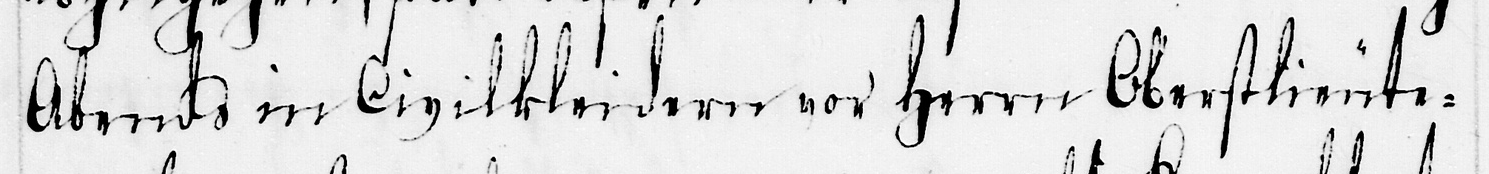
Abends in Civilkleidern vor Herrn Oberstlieute¬
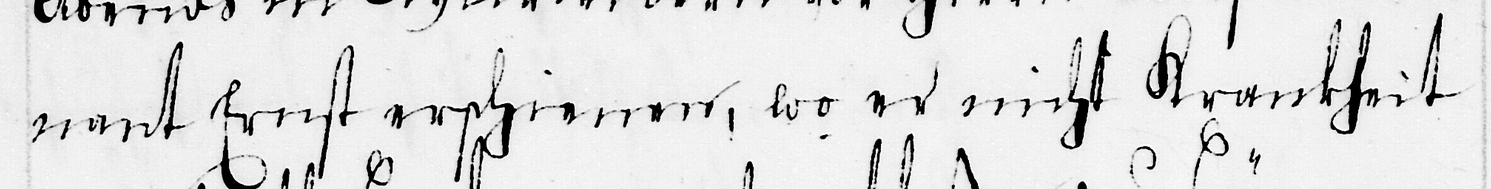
nant Ernst erschienen, wo er nicht Krankheit
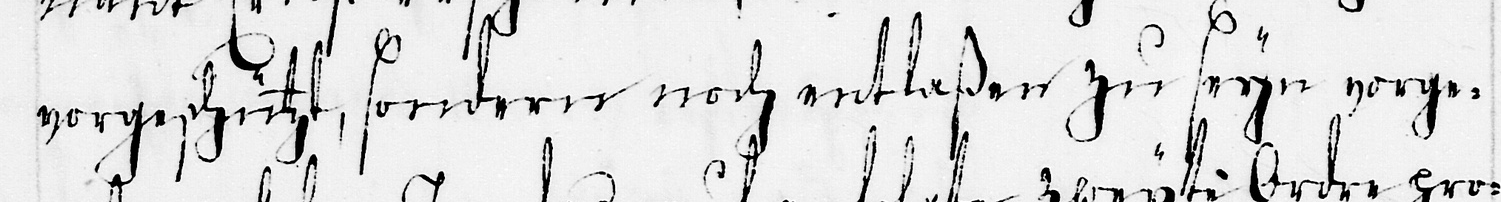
vorgeschützt, sondern noch entlaßen zu seyn vorge¬
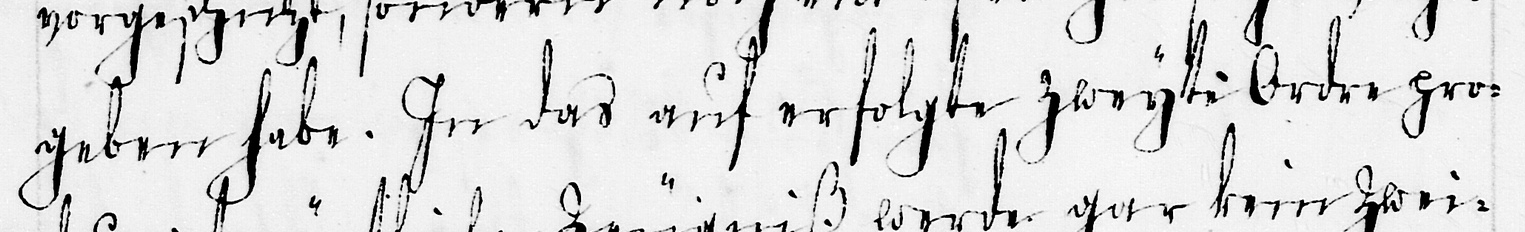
geben habe. In das auf erfolgte zweyte Ordre pro¬
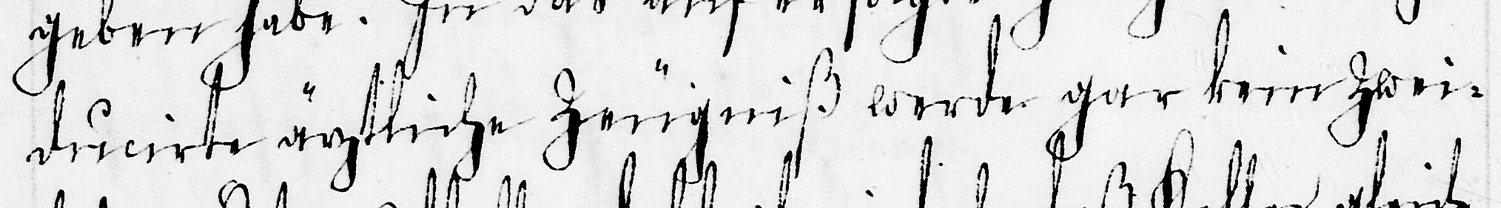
ducirte ärztliche Zeugniß werde gar kein Zwei¬
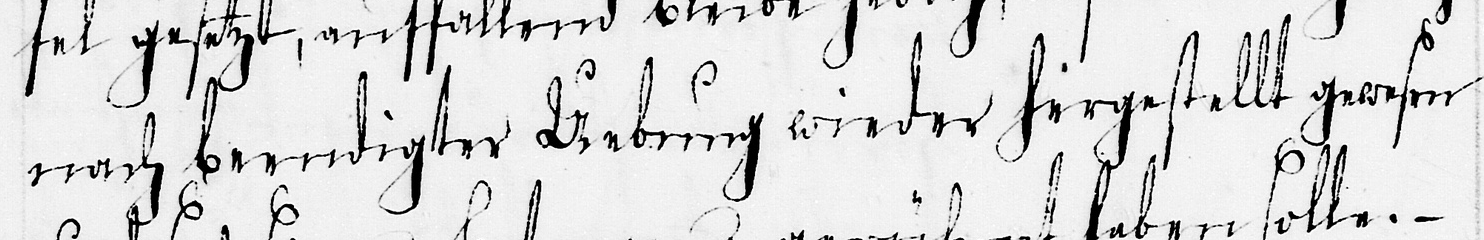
nach beendigter Uebung wieder hergestellt gewesen
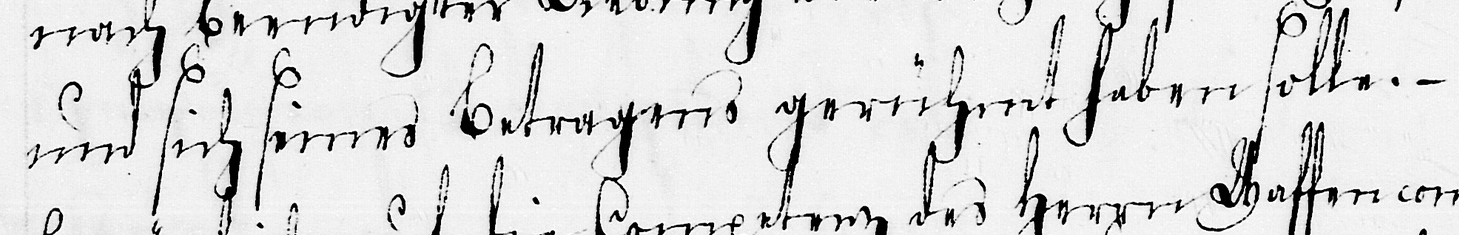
und sich seines Betragens gerühmt haben solle.
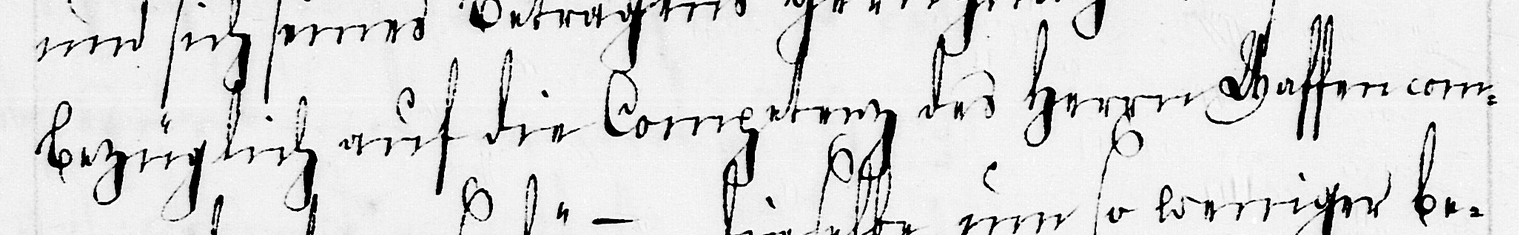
Bezüglich auf die Competenz des Herrn Waffencom¬
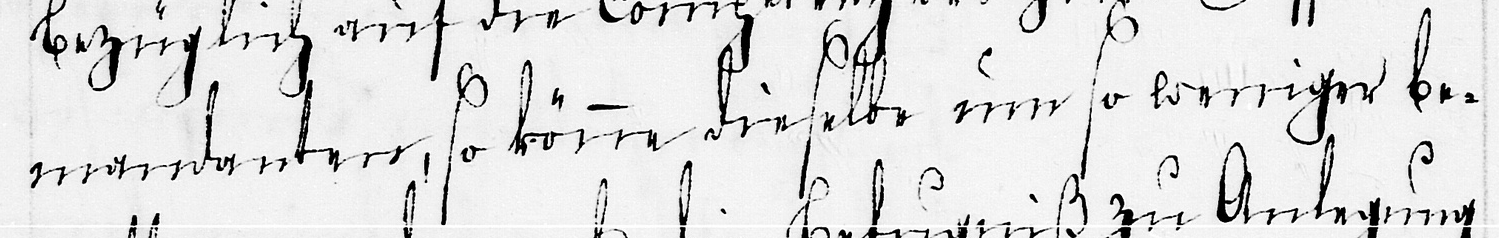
mandanten, so könne dieselbe um so weniger be¬
